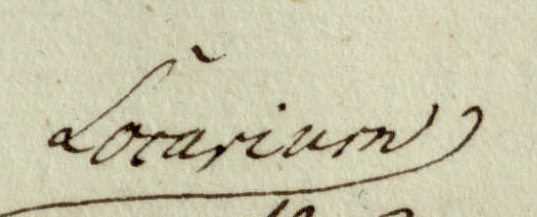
Locarium
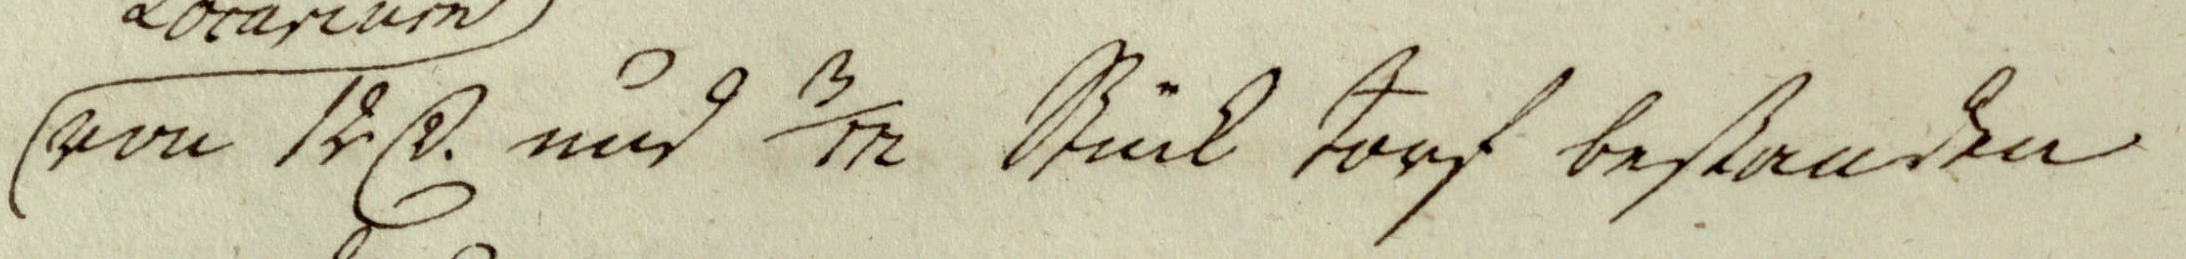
von 12 l. und 3/m Stück Torf bestanden
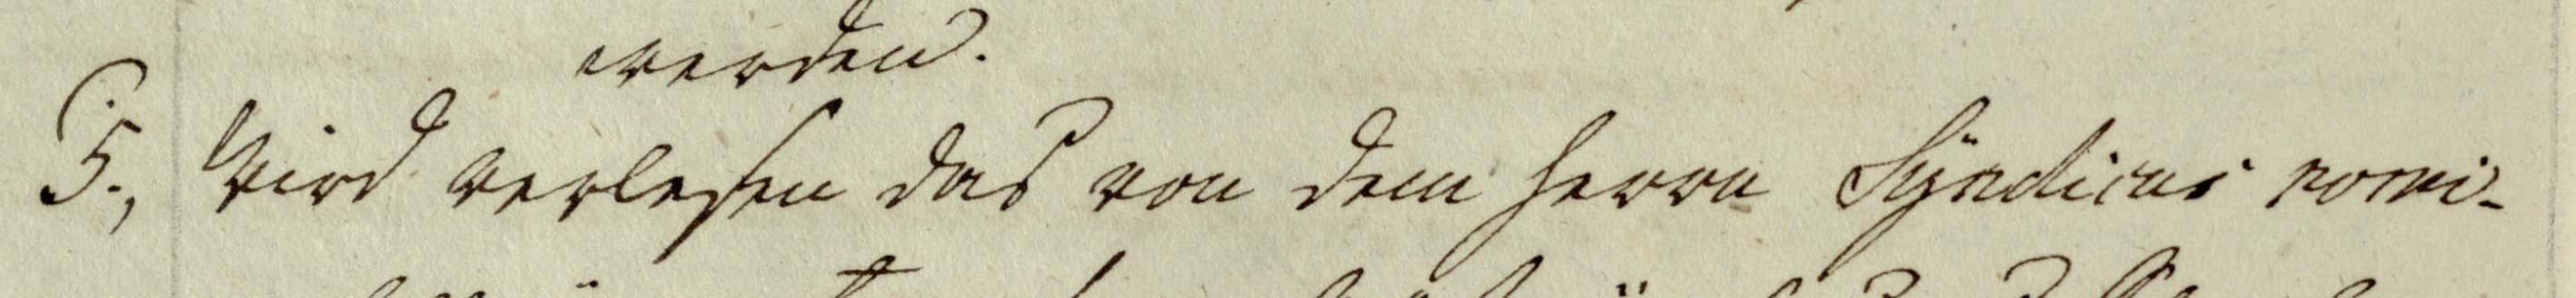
5., Wird verlesen das von dem Herrn Sÿndicus nomi¬
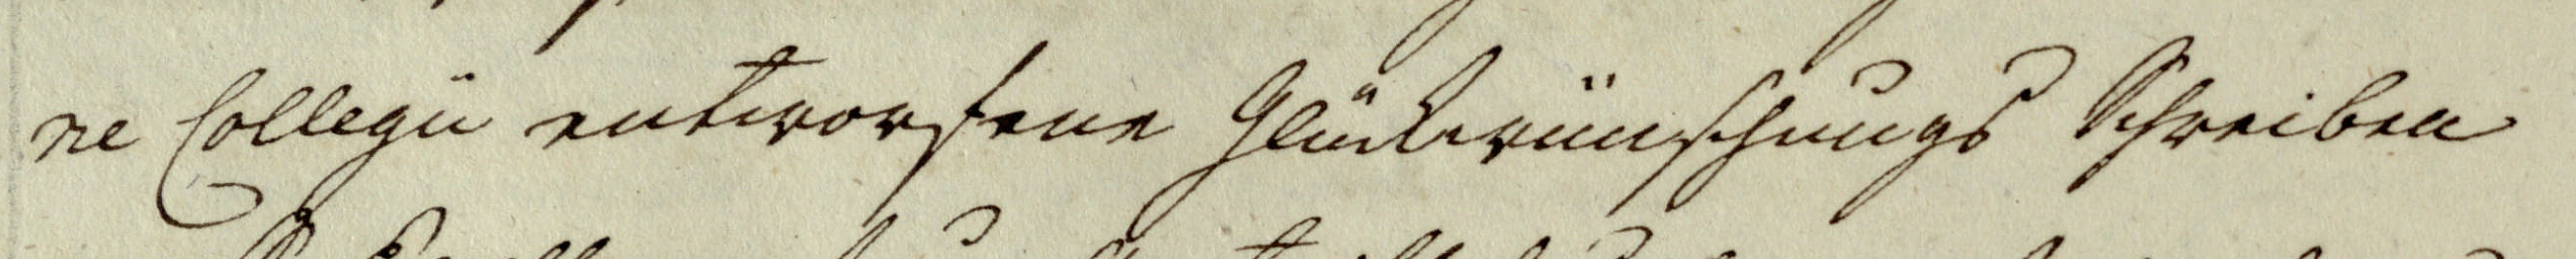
ne Collegii entworfene Glückwünschungs Schreiben
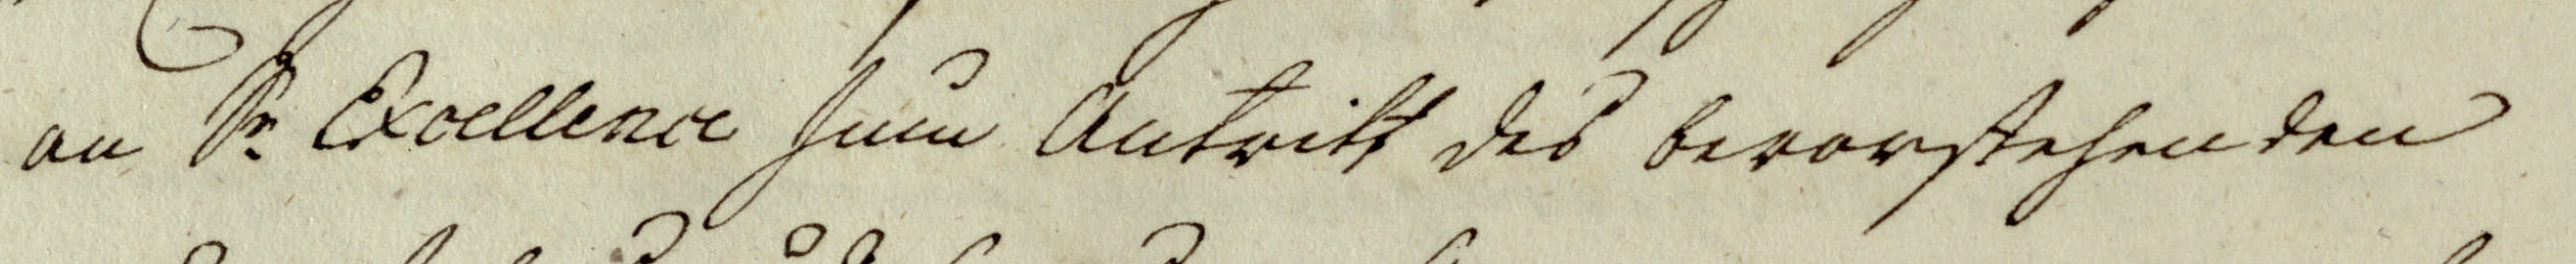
an Sr Excellence zum Antritt des bevorstehenden
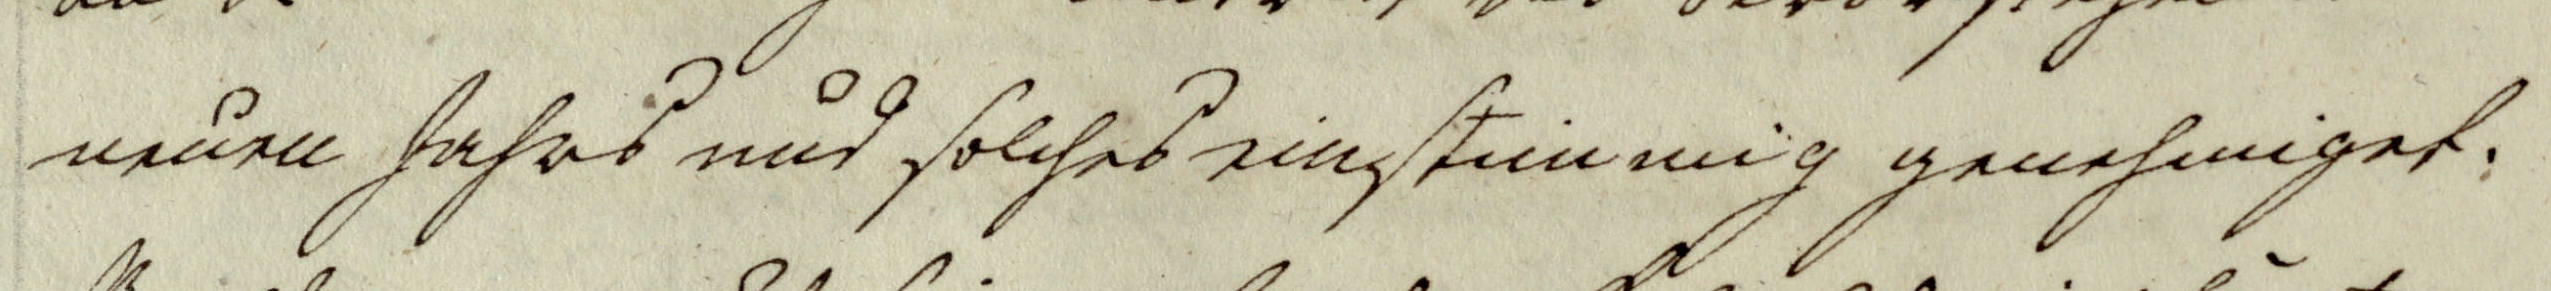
neuen Jahrs und solches einstimmig genehmiget.
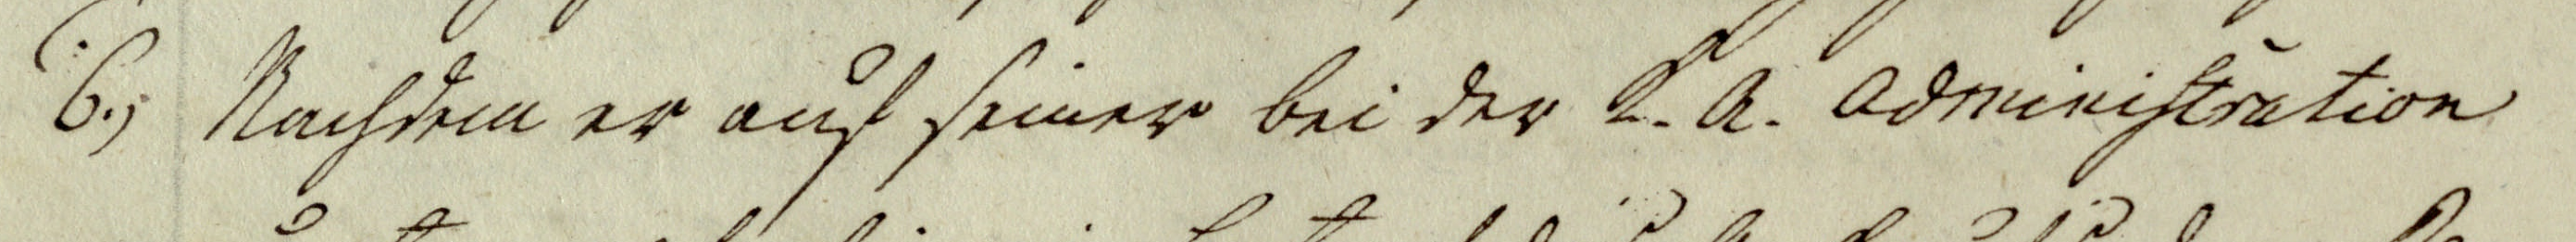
6., Nachdem er auf seiner bei der K. A. Administration
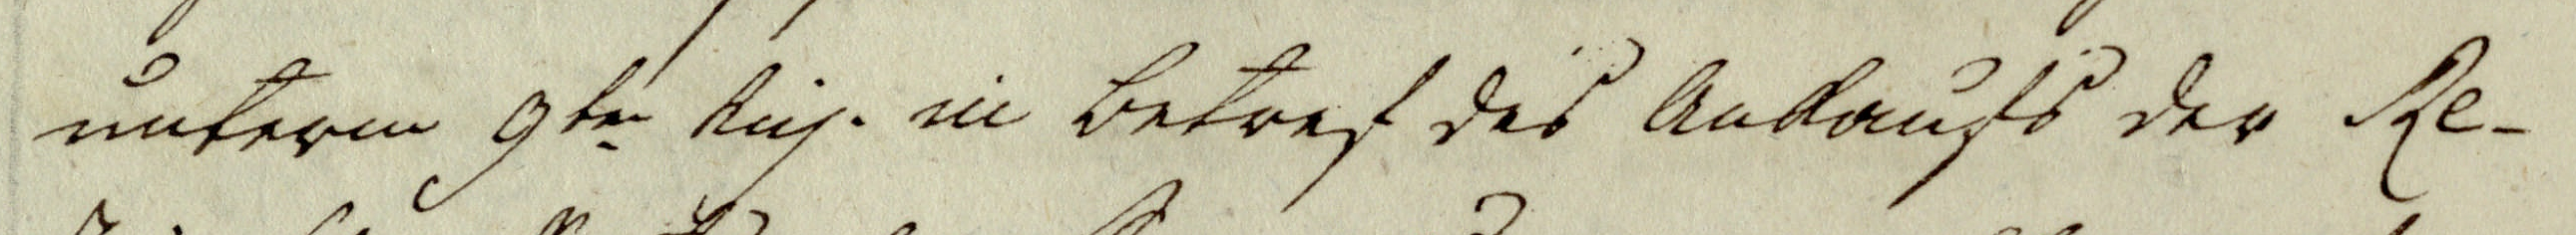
unterm 9 ten huj. in Betref des Ankaufs der Re¬
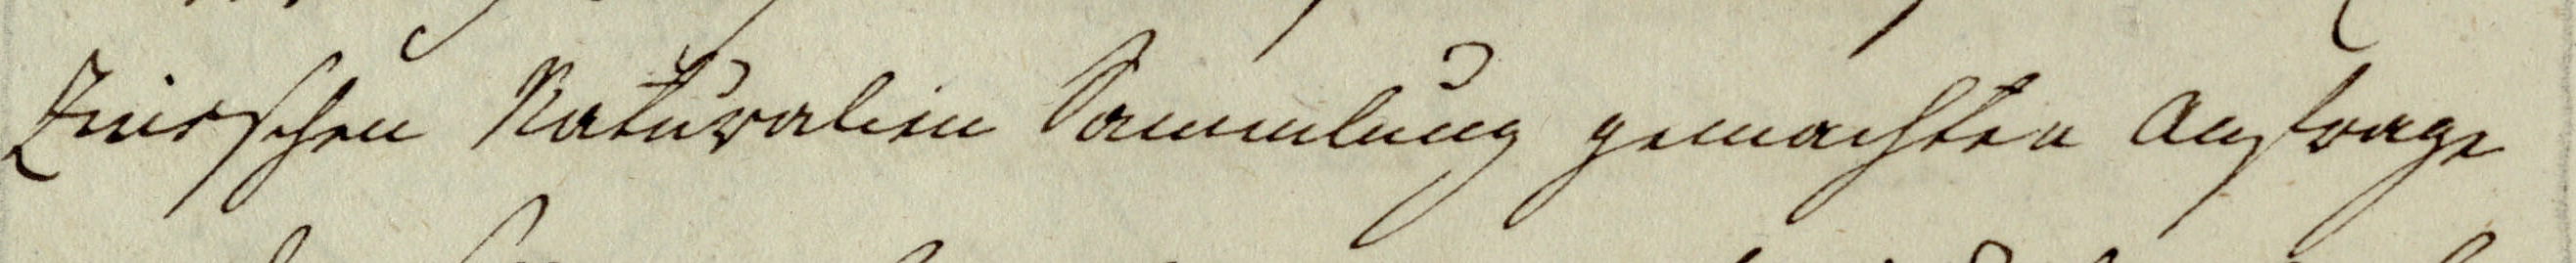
ziusschen Naturalien Sammlung gemachten Anfrage
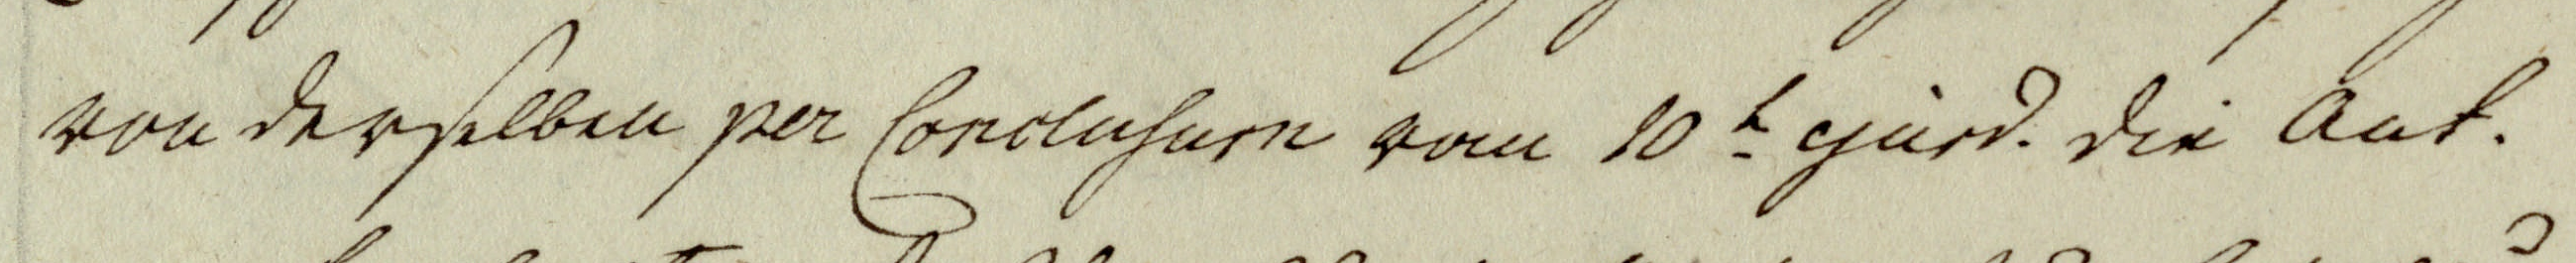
von derselben er Conclusum vom 10 t ejusd. die Ant¬
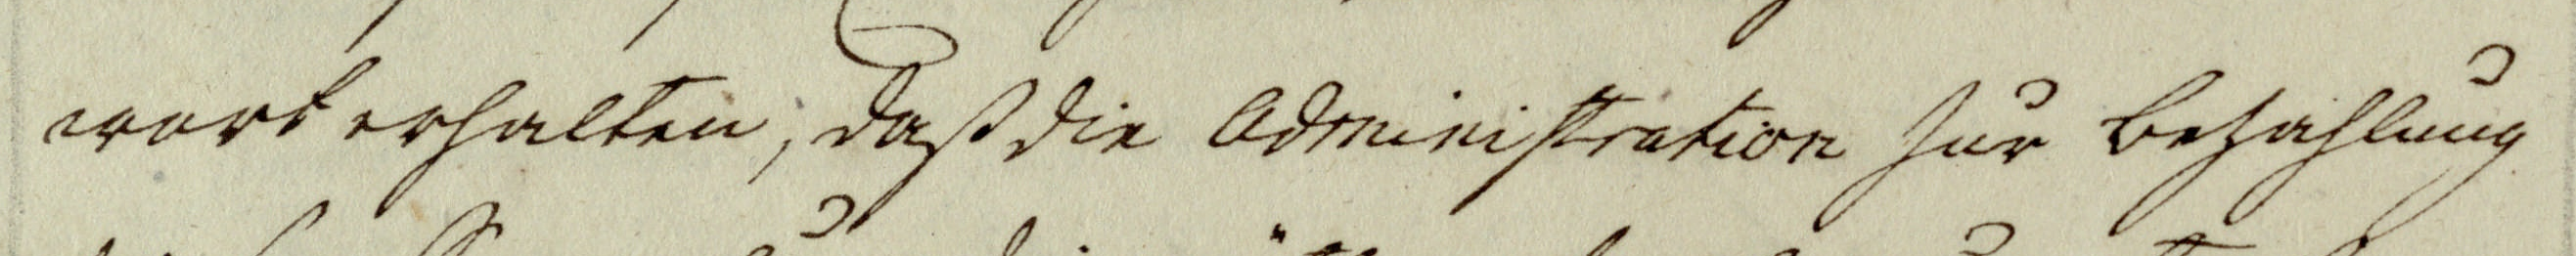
wort erhalten, daß die Administration zur Bezahlung
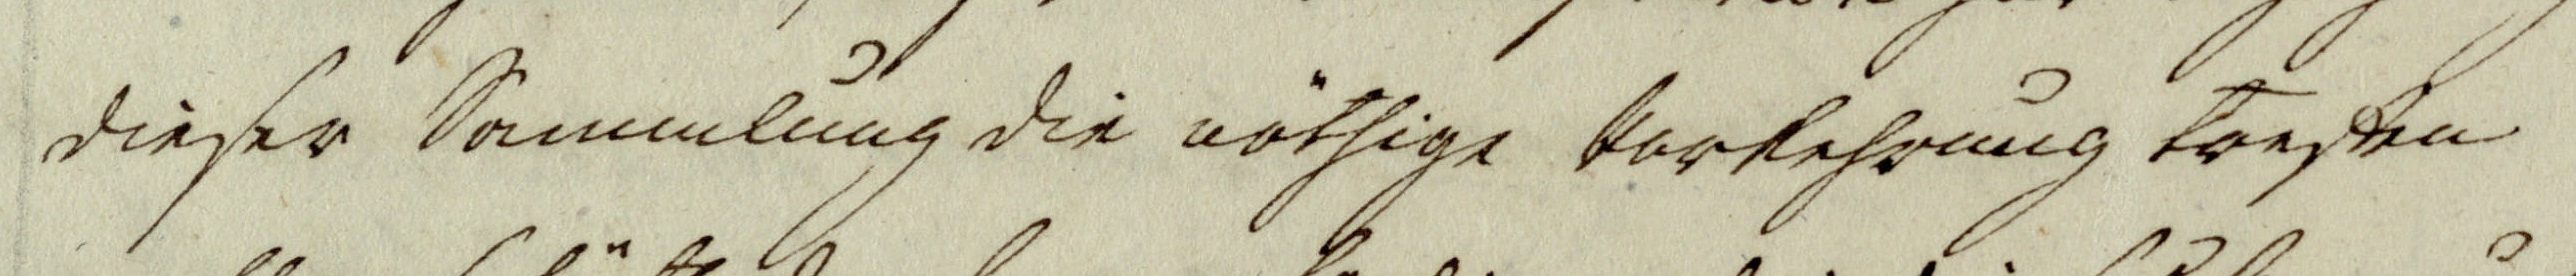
dieser Sammlung die nöthige Vorkehrung treffen
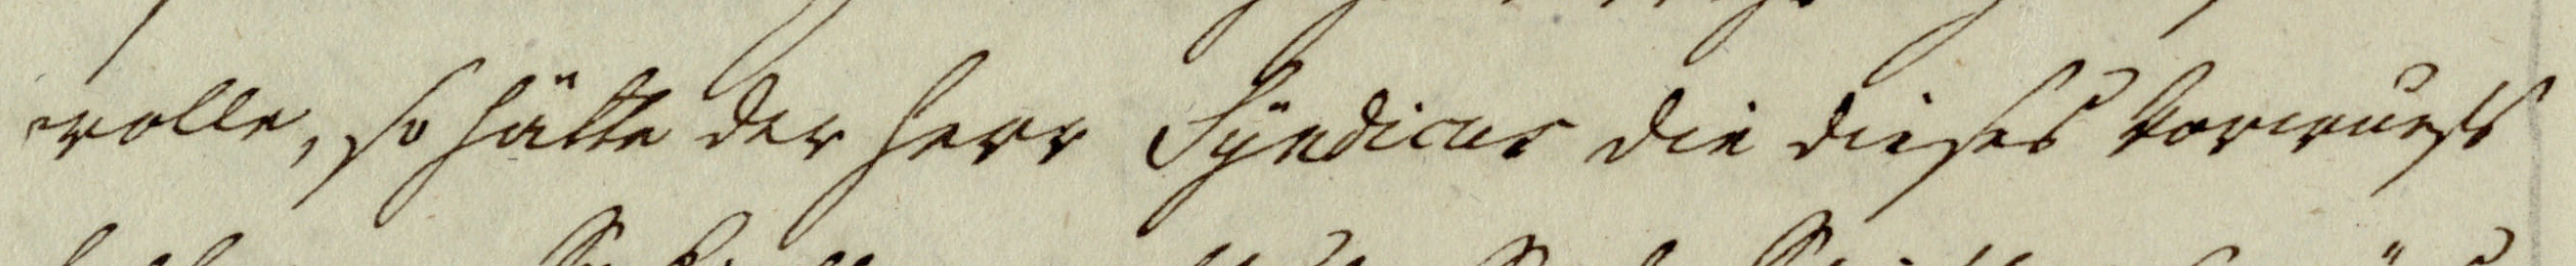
wolle, so hätte der Herr Sÿndicus die dieses Vorwurfs
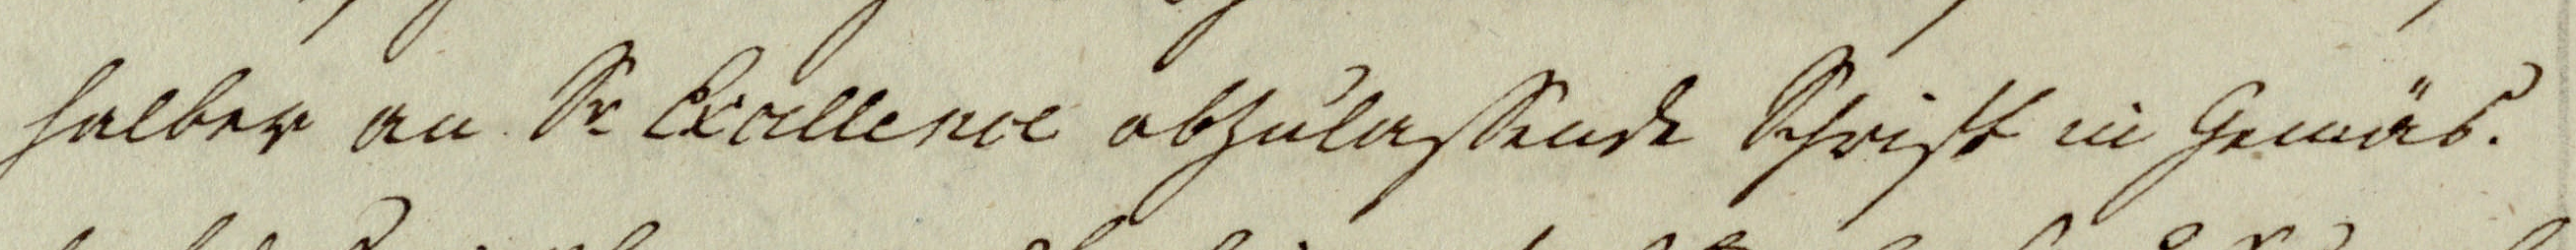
halber an Sr Excellence abzulassende Schrift in Gemäs¬
